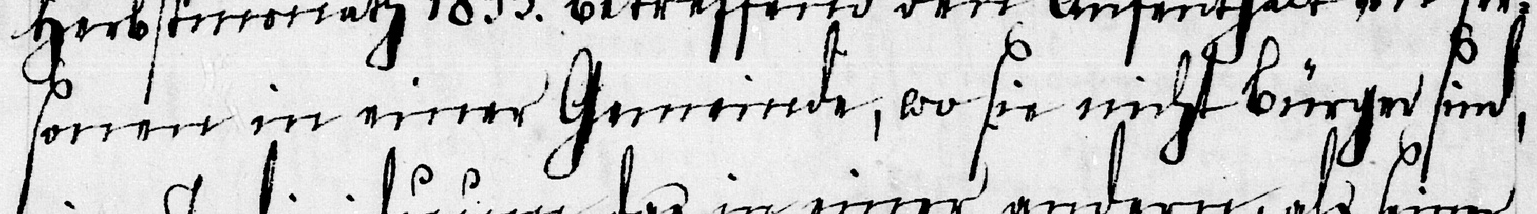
sonen in einer Gemeinde, wo sie nicht Bürger sind,
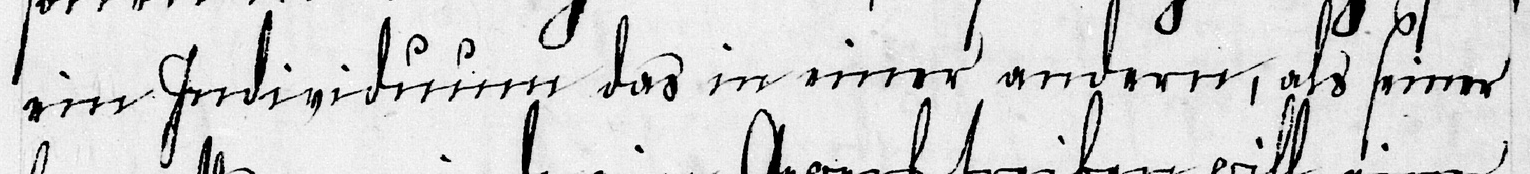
ein Individuum das in einer andern, als seiner
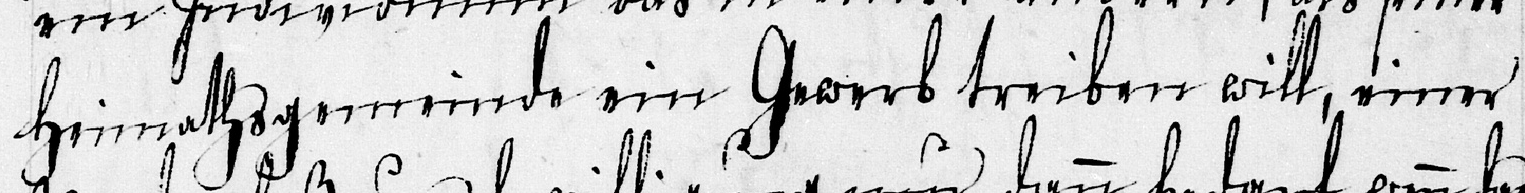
Heimathsgemeinde ein Gewerb treiben will, einer
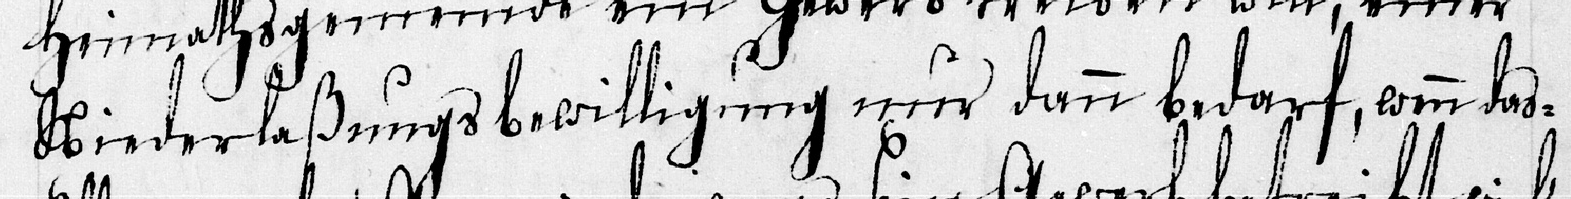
Niederlaßungsbewilligung nur dann bedarf, wenn daß¬
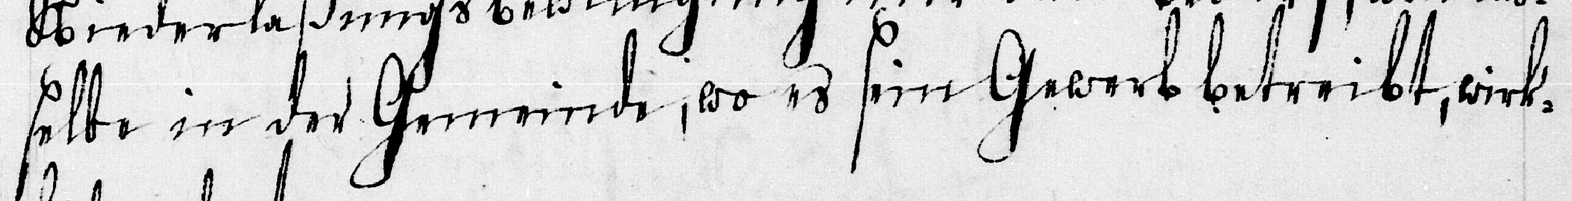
elbe in der Gemeinde, wo es sein Gewerb betreibt, wirk¬
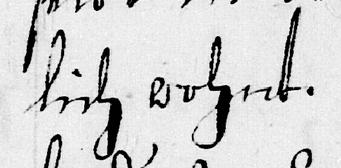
lich wohnt.
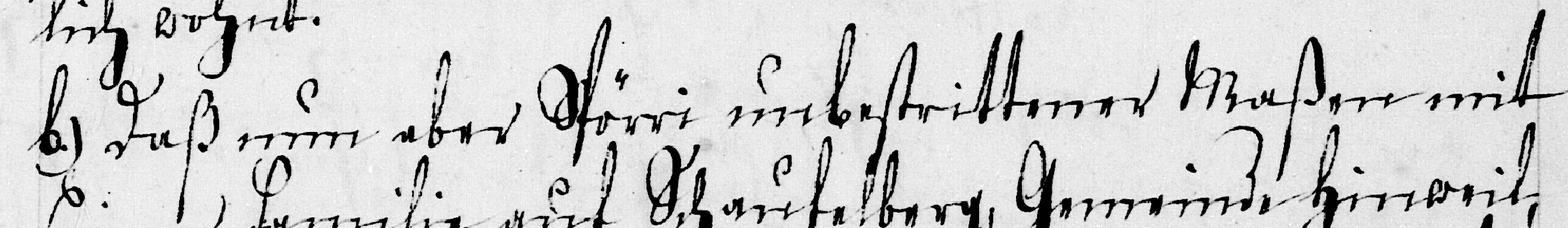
b.) Daß nun aber Spörri unbestrittener Maßen mit
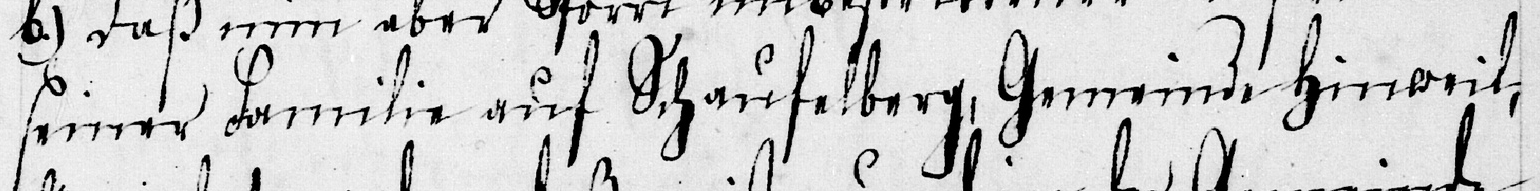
seiner Familie auf Schaufelberg, Gemeinde Hinweil,
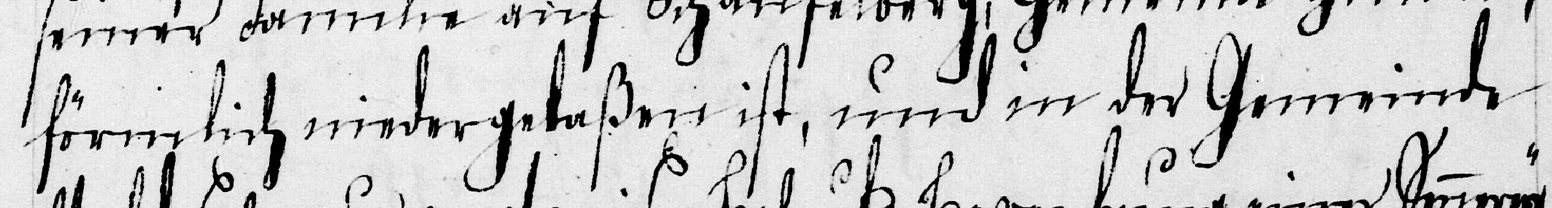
förmlich niedergelaßen ist, und in der Gemeinde
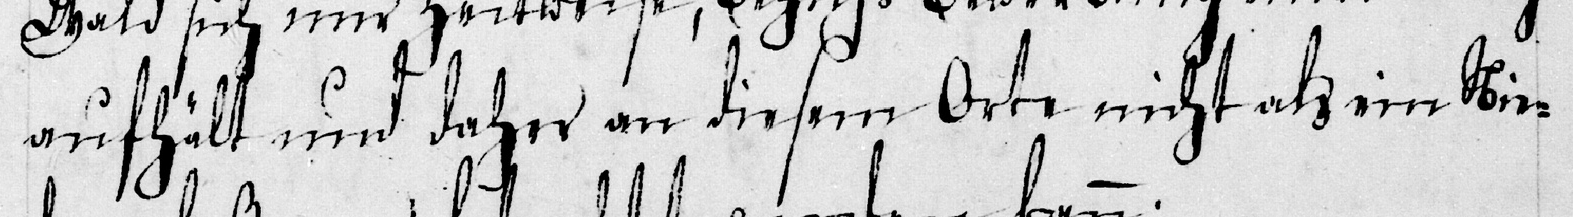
aufhält und daher an diesem Orte nicht als ein Nie¬
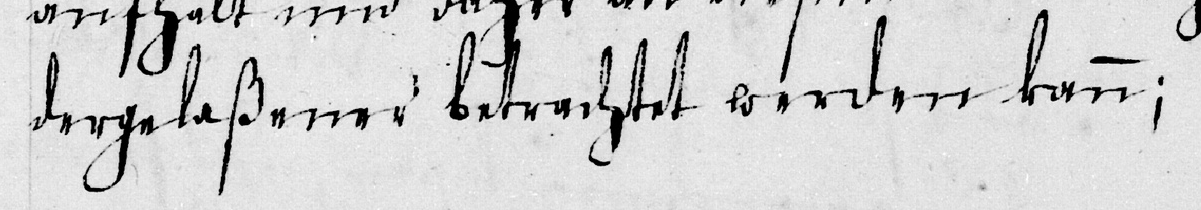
dergelaßener betrachtet werden kann;
